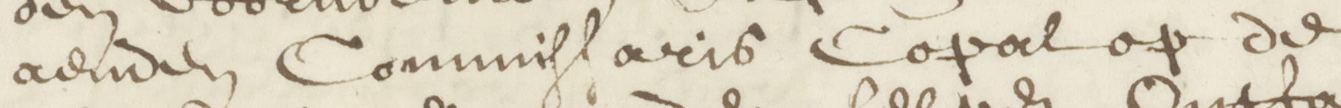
aenden Commissaris Copal op de
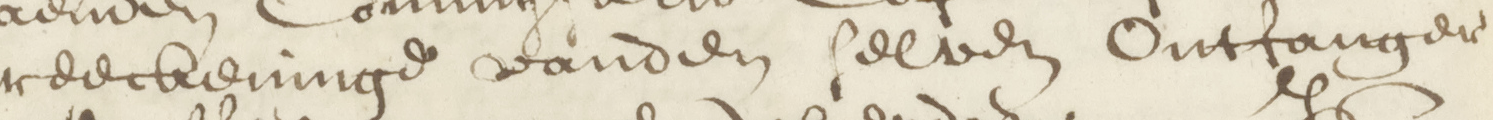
reeckeninge vanden selven Ontfanger
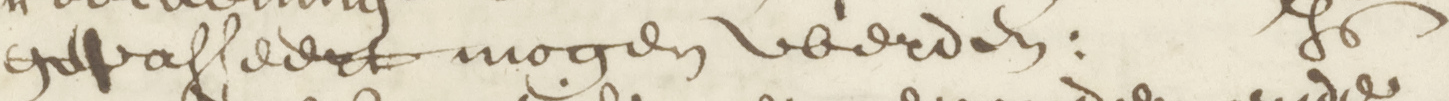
gepasseert mogen werden: Is
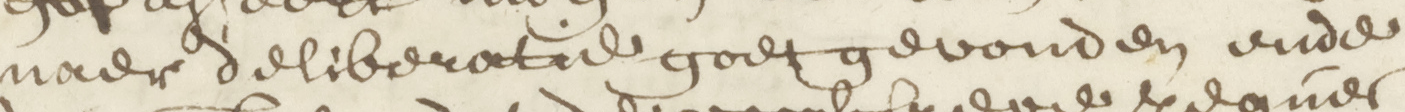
naer deliberatie goetgevonden ende
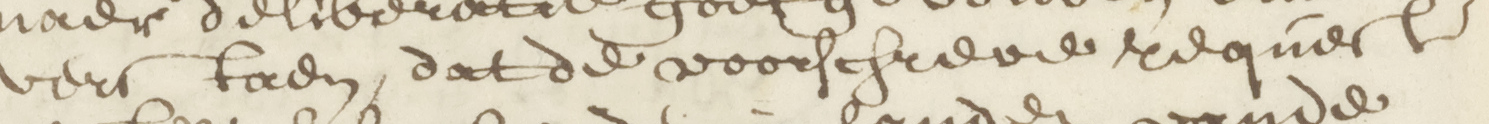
verstaen, dat de voorschreve requeste
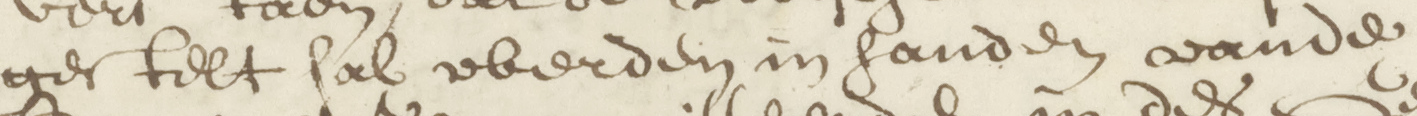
gestelt sal werden in handen vande
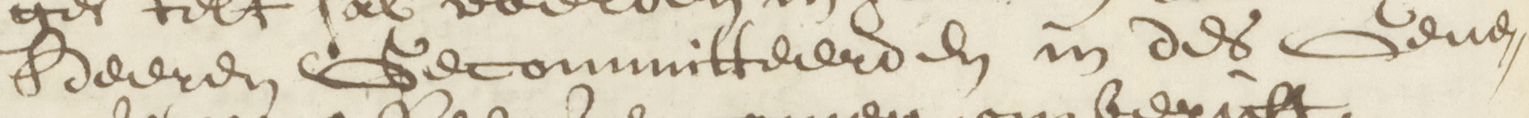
Heeren Gecommitteerden in des Gene„
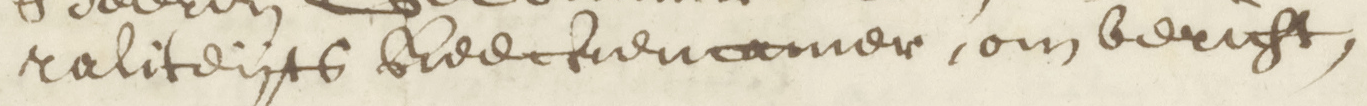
raliteijts Reeckencamer, om bericht.
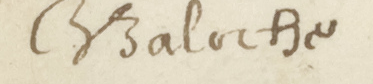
Baloche
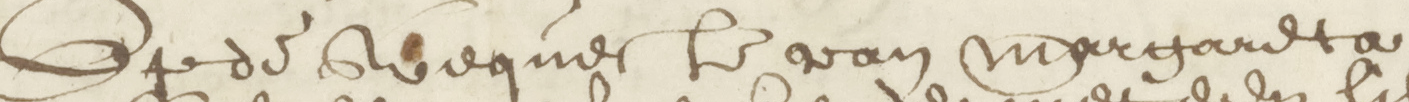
Opde Requeste van Margareta
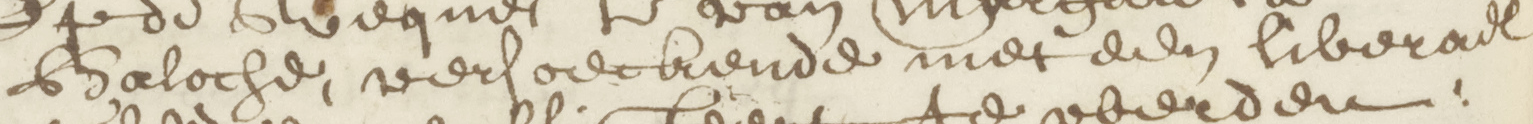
Baloche, versoeckende met een liberael
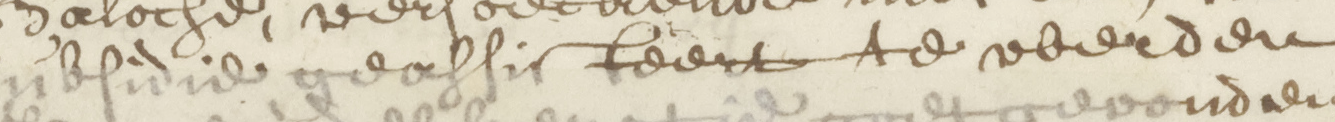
subsidie geassisteert te werden:
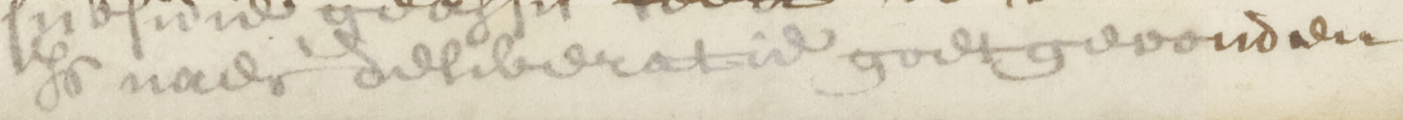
Is naer deliberatie goetgevonden
